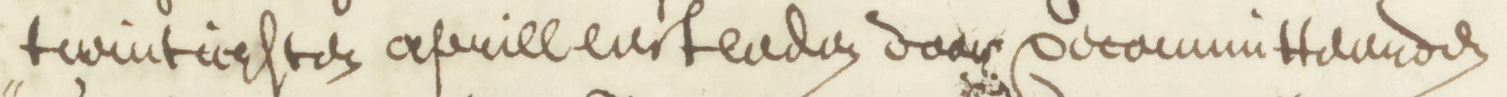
twintichsten aprill lestleden daer sij Gecommitteerden
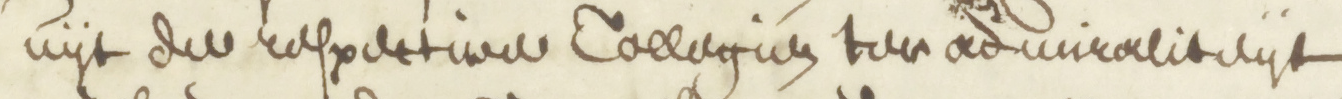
uijt de respective Collegien ter admiraliteijt
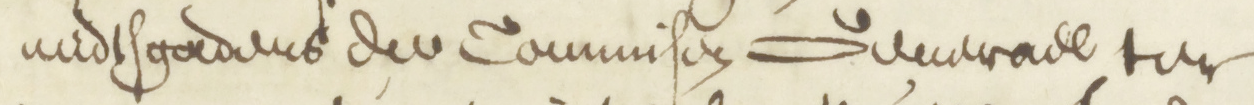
midtsgaders de Commisen Generael ter
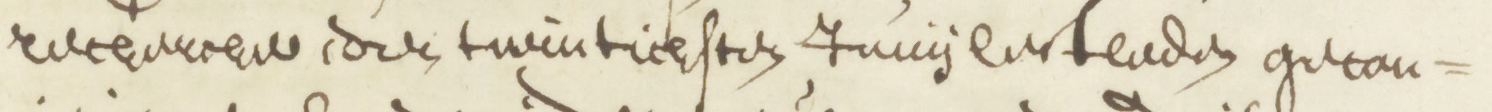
recherche, den twintichsten Junij lestleden gecon=
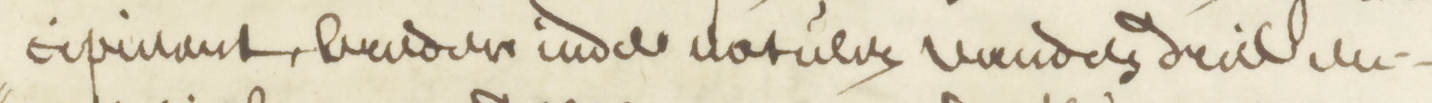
cipieert, breder inde notulen vanden drie en-
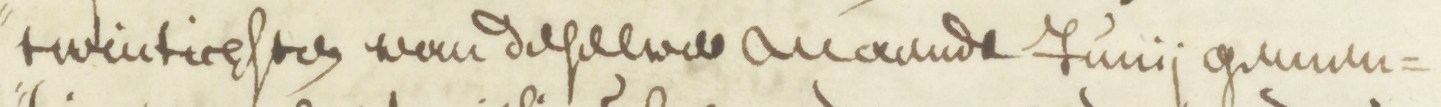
twintichsten van deselve maendt Junij gemen=
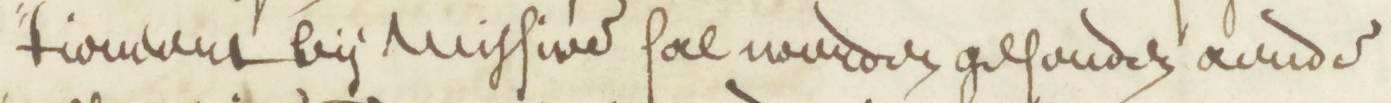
tioneert bij Missive sal werden gesonden aende —
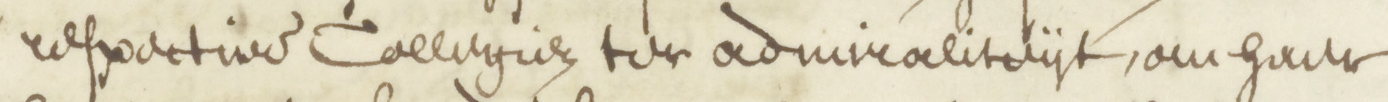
respective Collegien ter admiraliteijt, om haer
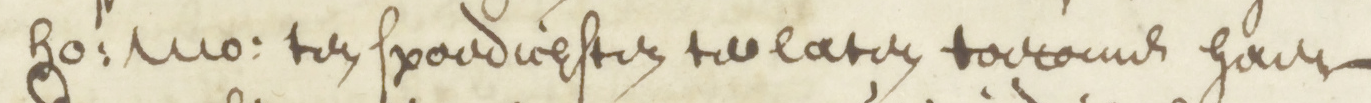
Ho:Mo: ten spoedichsten te laten toecomen haer
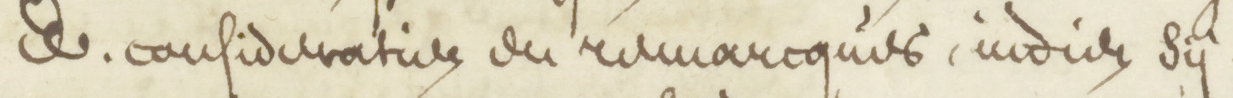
E. consideratien en remarques, indien sij —
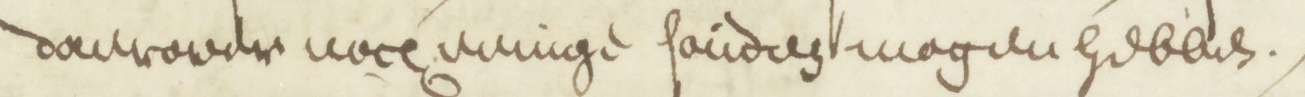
daerover noch eenige souden mogen hebben.
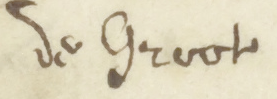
de Groot
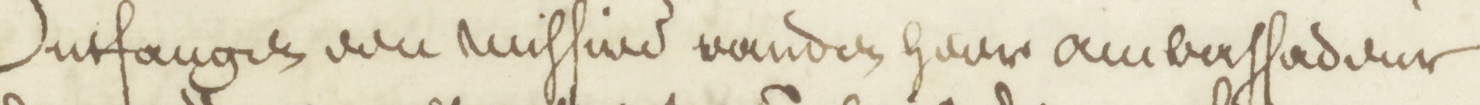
Ontfangen een missive vanden heer ambassadeur
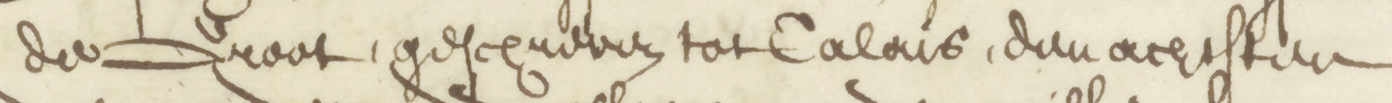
de Groot, geschreven tot Calais, den achtsten
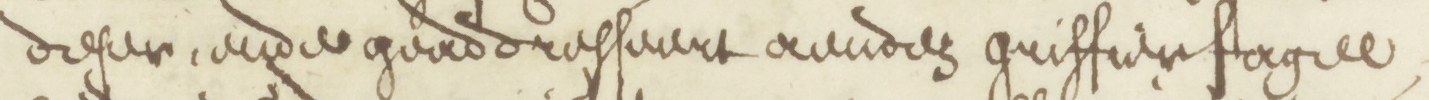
deser, ende geadresseert aenden griffier Fagel, —
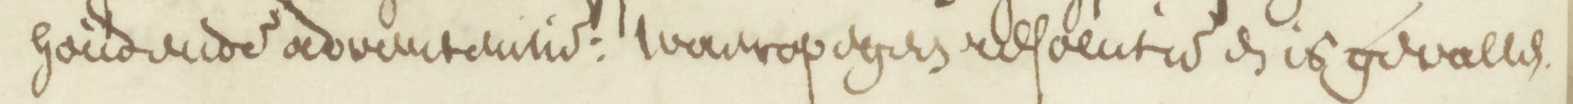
houdende advertentie: waerop egeen resolutie en is gevallen.
